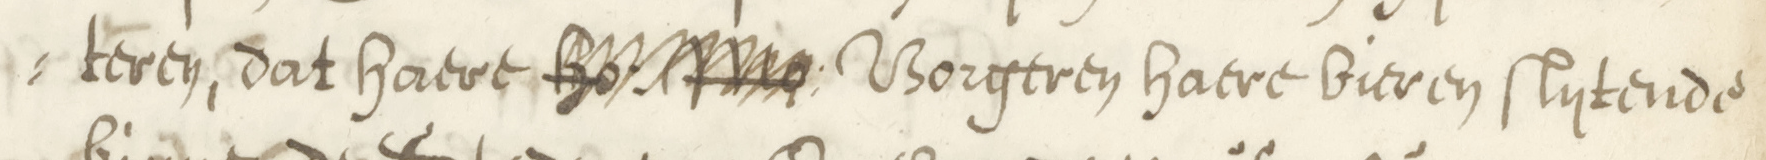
,,teren dat haere Ho:Mo: Borgeren haere bieren slytende
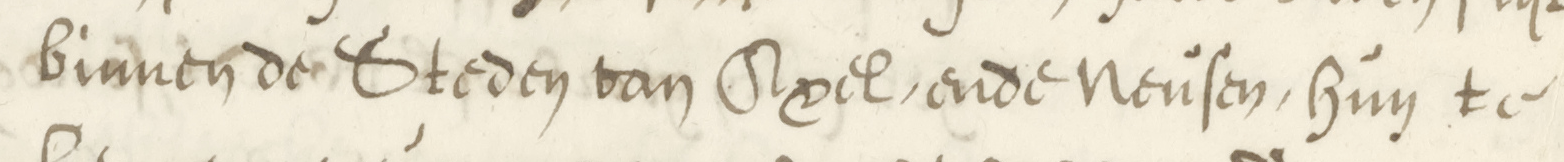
binnen de Steden van Axel, ende Neusen, hun te
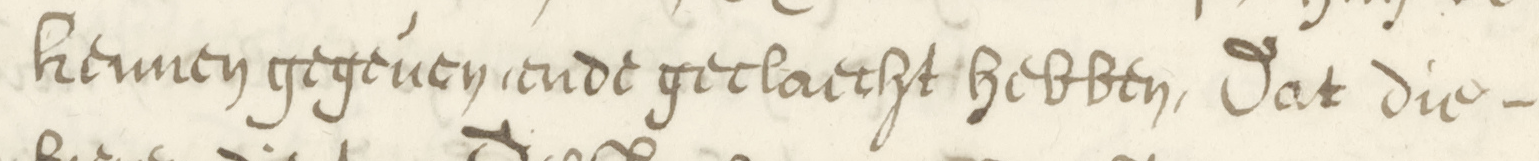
kennen gegeuen ende geclaecht hebben, Dat die
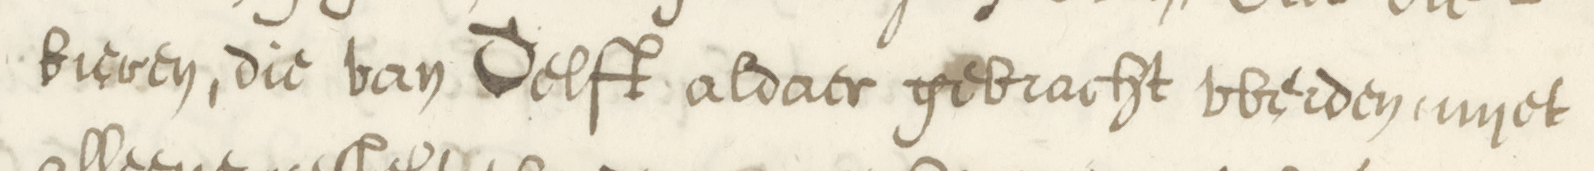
bieren, die van Delft aldaer gebracht werden, nyet
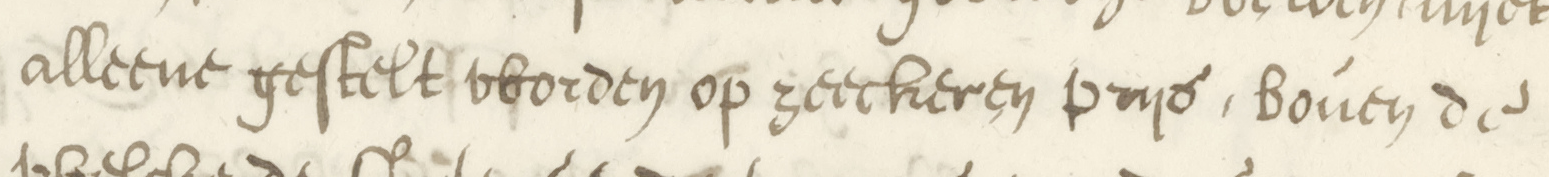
alleene gestelt worden op zeeckeren prys, bouen de
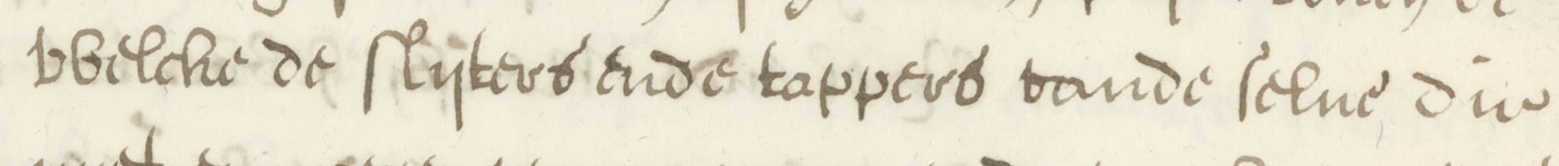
welke de slyters ende tappers vande selue die
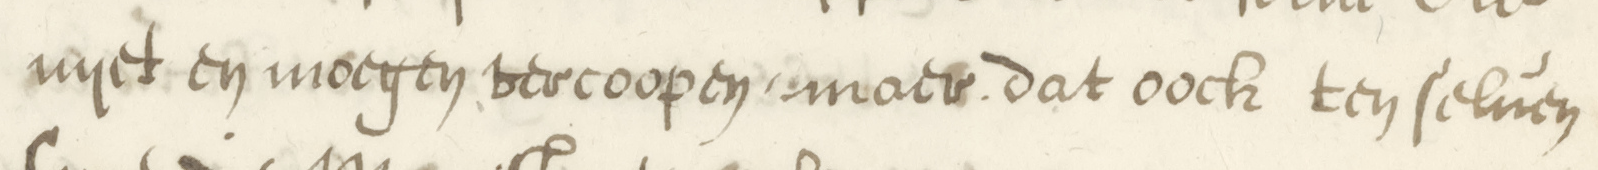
nyet en moegen vercoopen, maer dat oock ten seluen
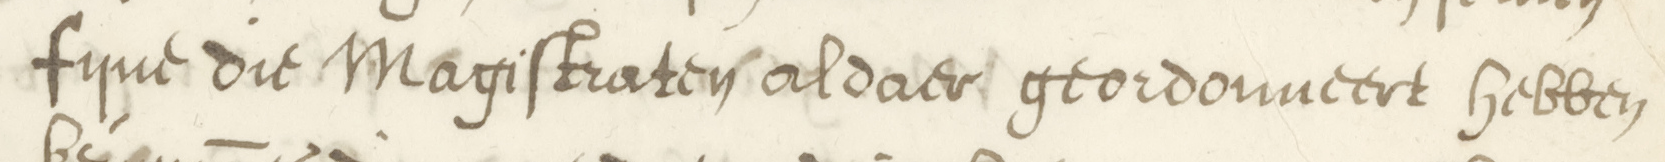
fyne die Magistraten aldaer geordonneert hebben
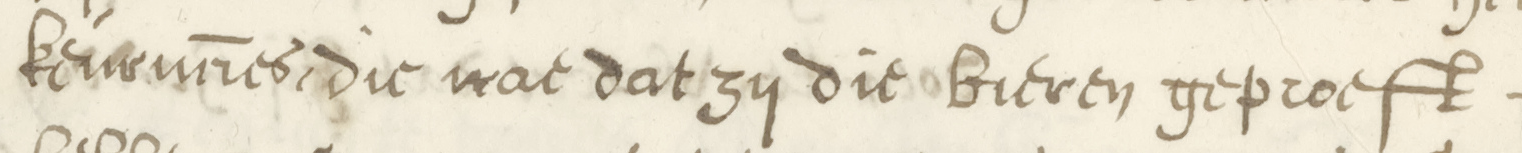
keurmres die nae dat zij die bieren geproeft
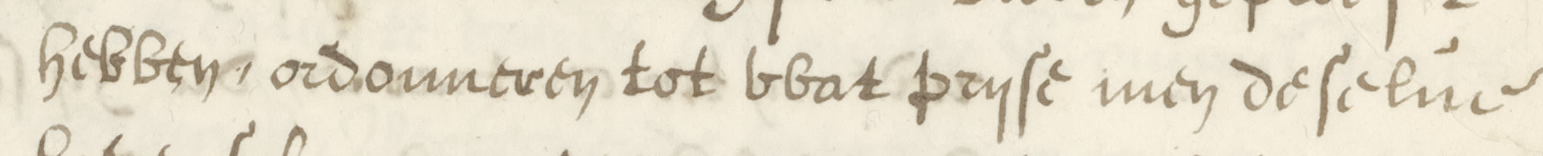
hebben, ordonneren tot wat pryse men deselue
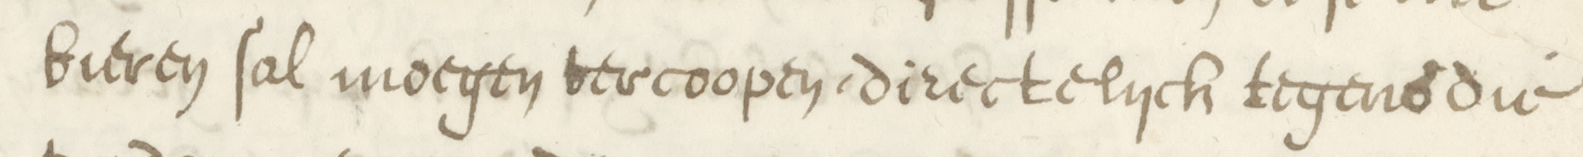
bieren sal moegen vercoopen, directelyck tegens die
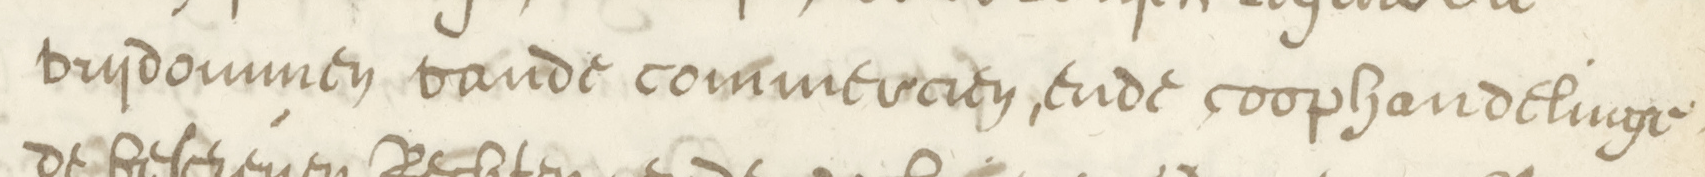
vrydommen vande commercien, ende coophandelinge
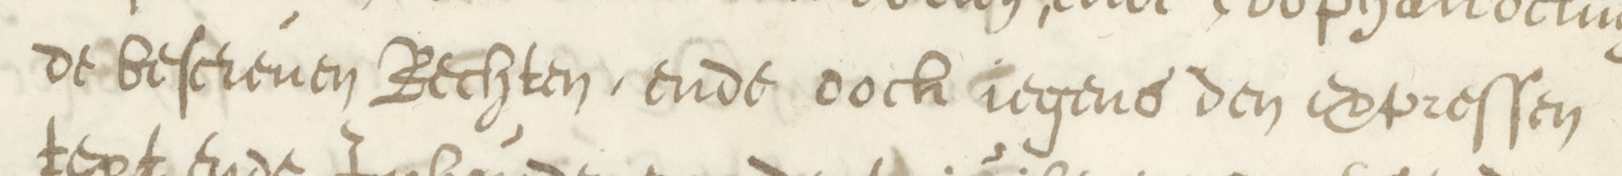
de bescreuen Rechten ende oock tegens den expressen
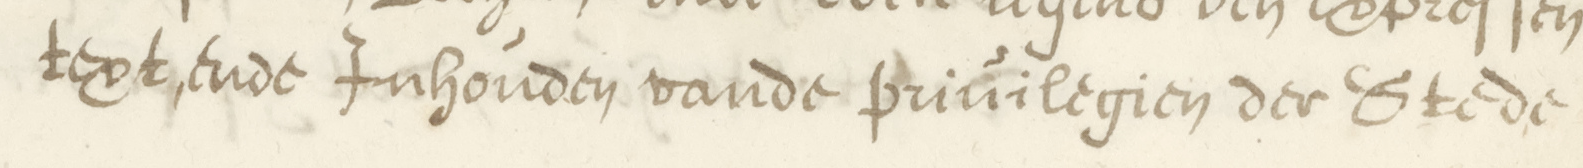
text, ende Inhouden vande priuilegien der Stede
